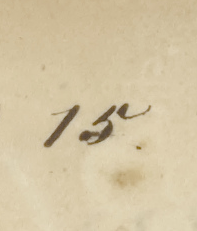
15.
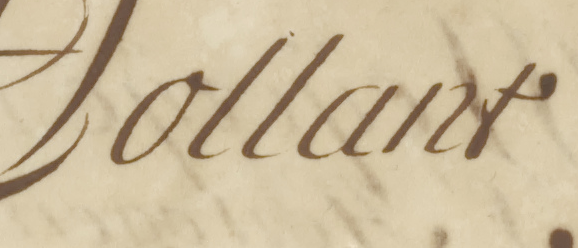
Hollant
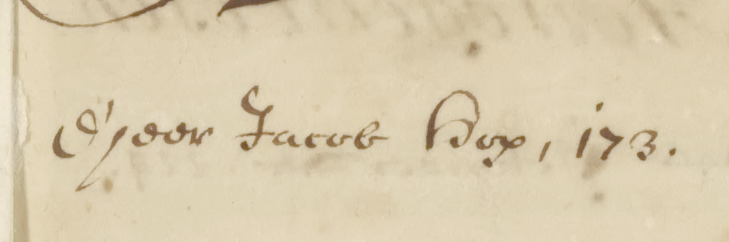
D'heer Jacob Hop, 173
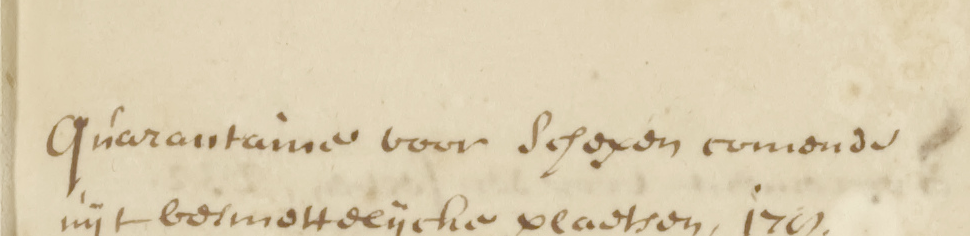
quarantaine voor Schepen comende
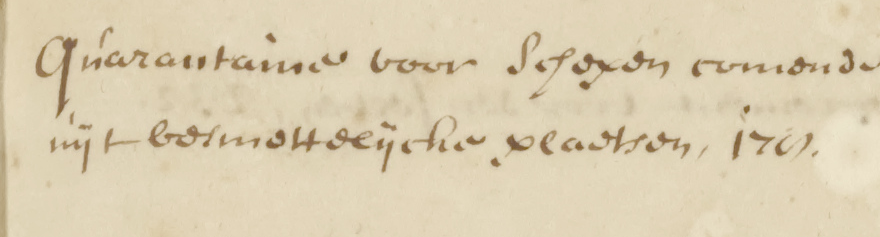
uijt besmettelijcke plaetsen, 178.
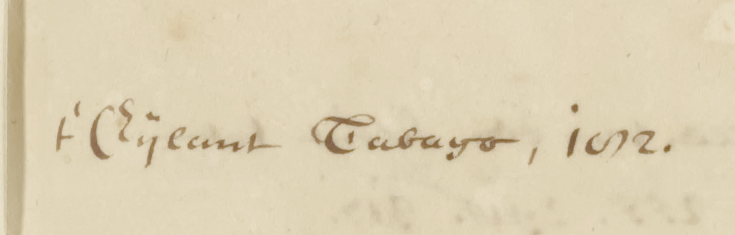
t' Eijlant Tabago, 182.
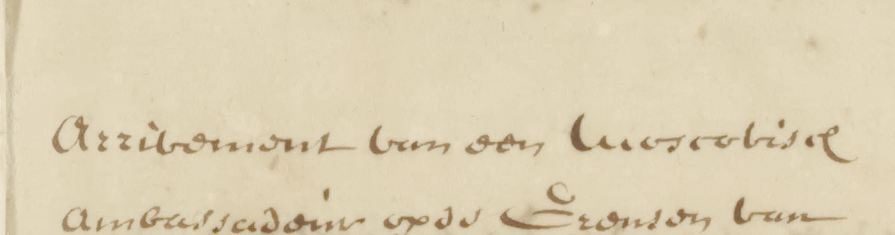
Arrivement van een moscovisch
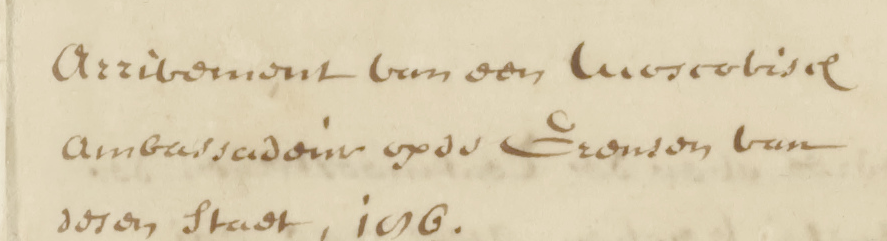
ambassadeur op de Grensen van
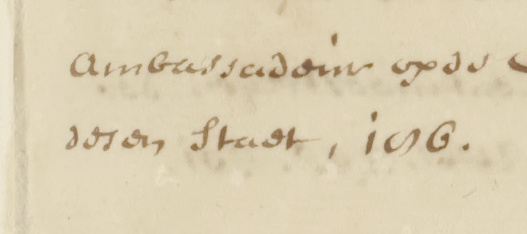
desen Staet, 186.
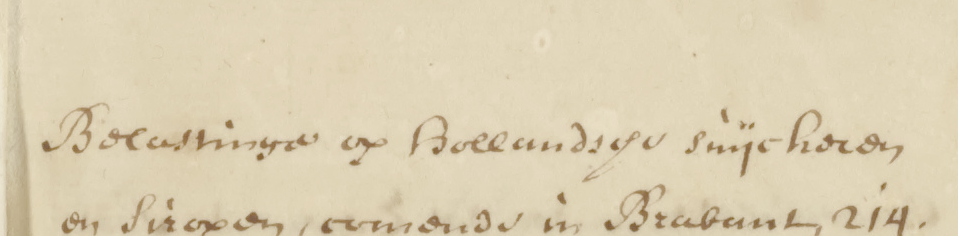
Belastinge op Hollandsche suijckeren
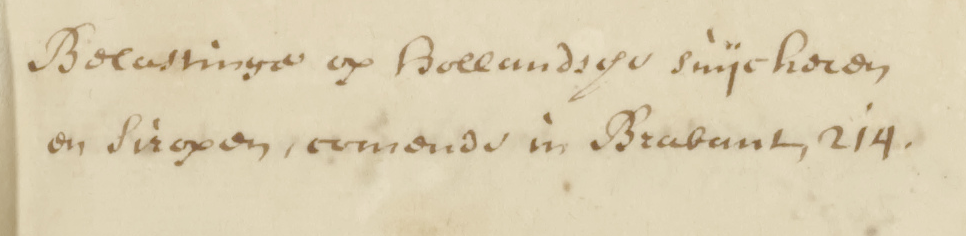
en siropen, comende in Brabant, 214.
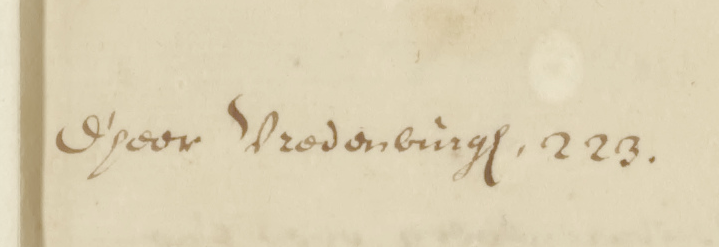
D'heer Vredenburgh, 223.
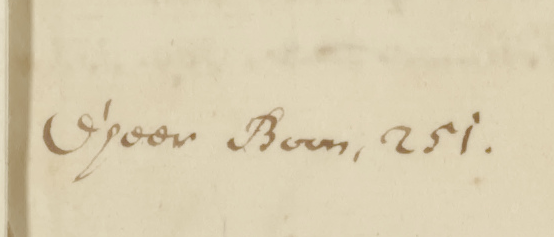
D'heer Boon, 251.
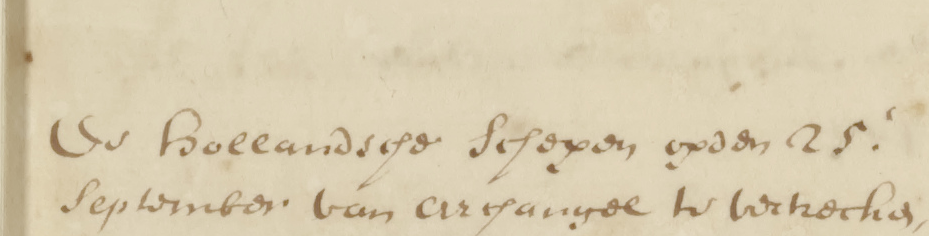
De Hollandsche Schepen opden 25e.
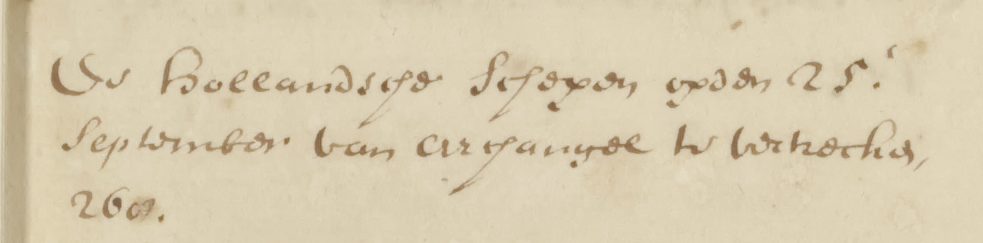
september van archangel te vertrecken,
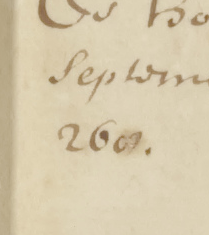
268.
